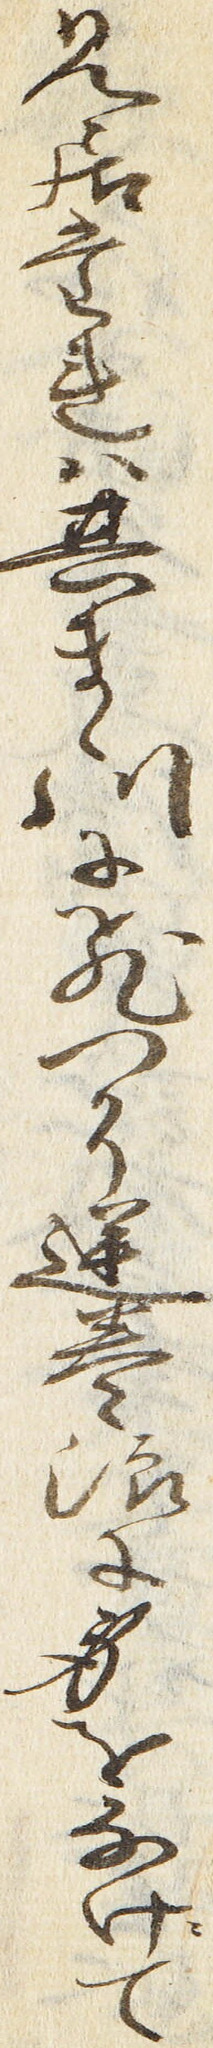見居れは其まゝ川に飛つかり逆巻浪に身をなげて
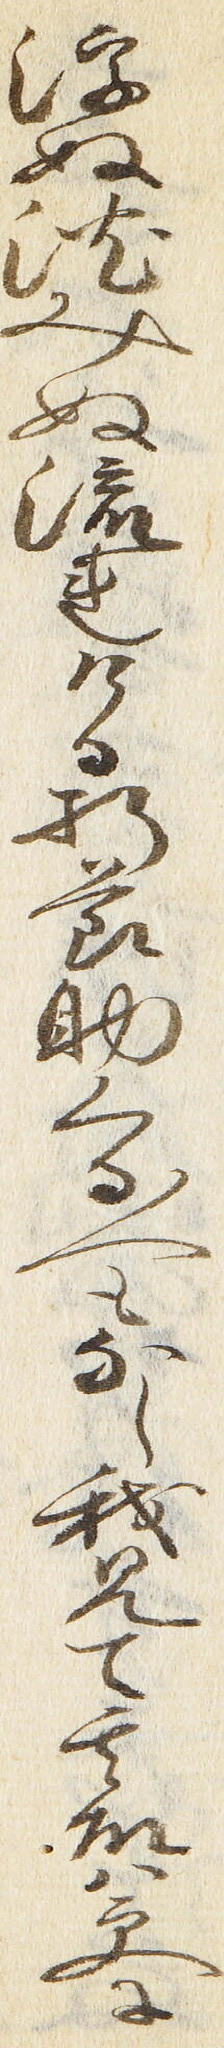浮ぬ沈みぬ流れける折節助くる人もなし我見て其故は更に
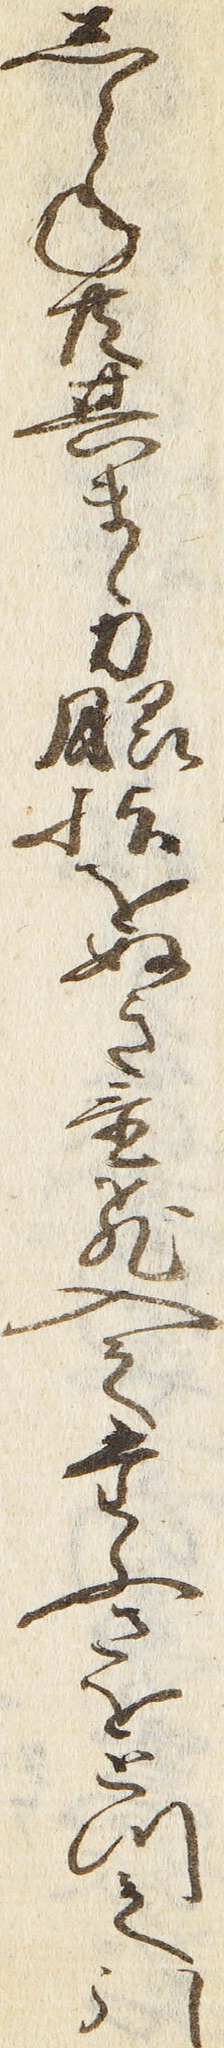しらね共其まゝ刀脇指をぬき置飛入てたふさをとつて引
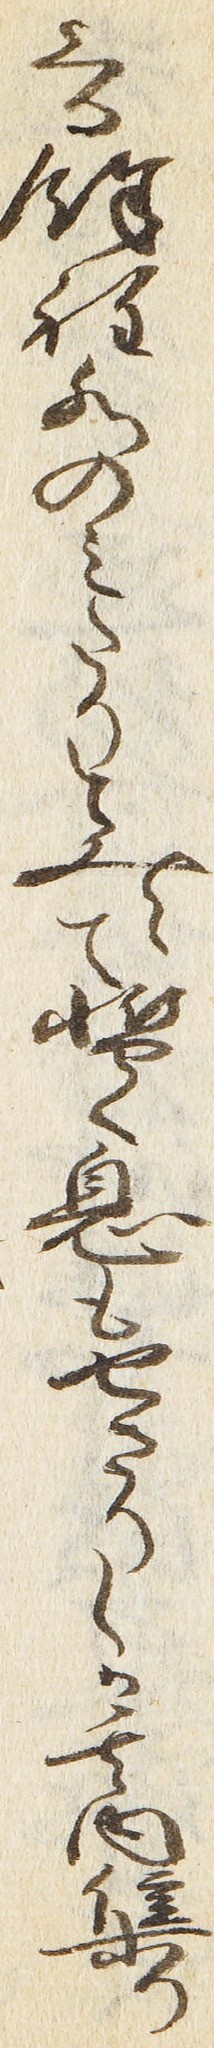上る余程水のみたりとみえて暫く息もせさりしか其内集り
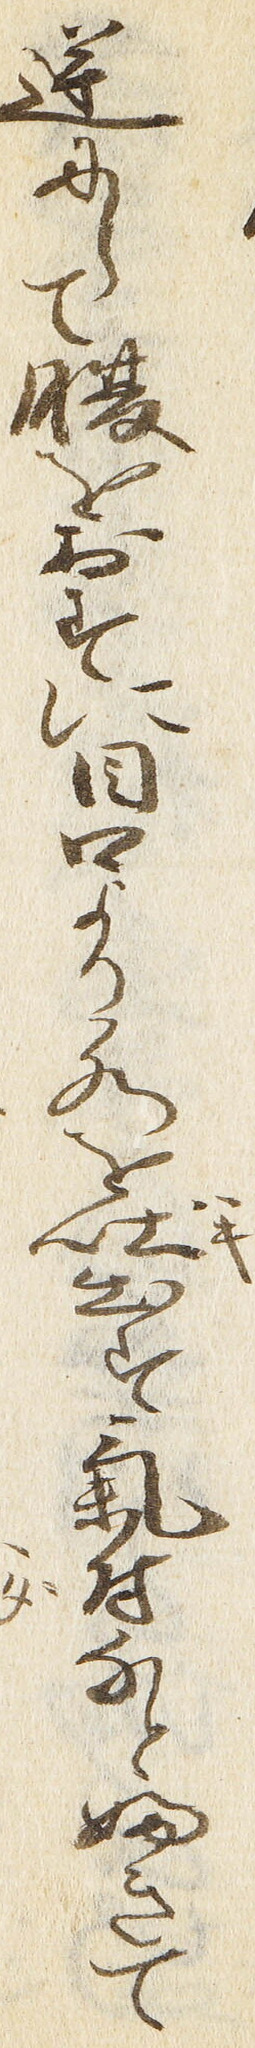逆にして腹をおすに目口より水を吐出す気付なとふきて
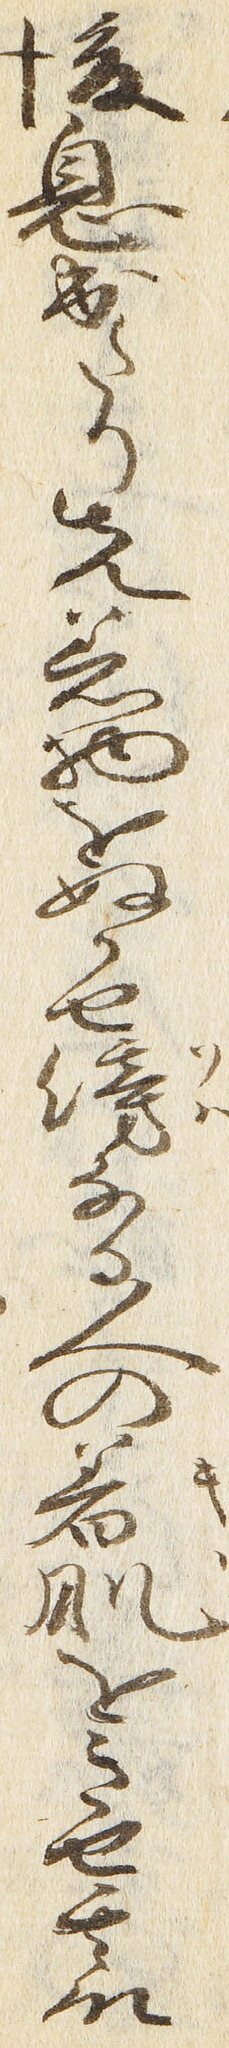後息出たり先着物をぬかせ傍なる人の着肌をきせ其故
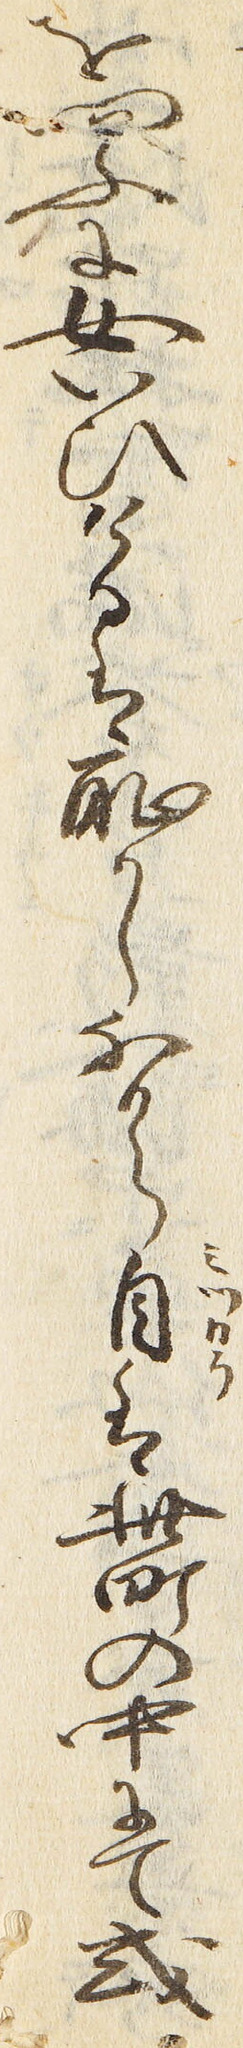を問ふに女いひけるは恥かしなから自は此町の中にて或
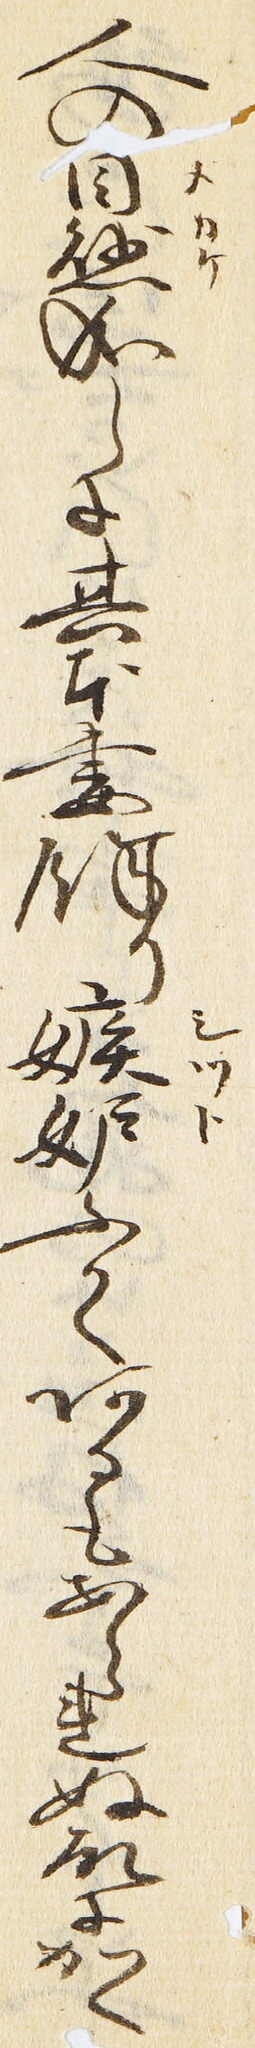人の目懸成しに其本妻余り嫉妒ふかくあるもあられぬ故にかく
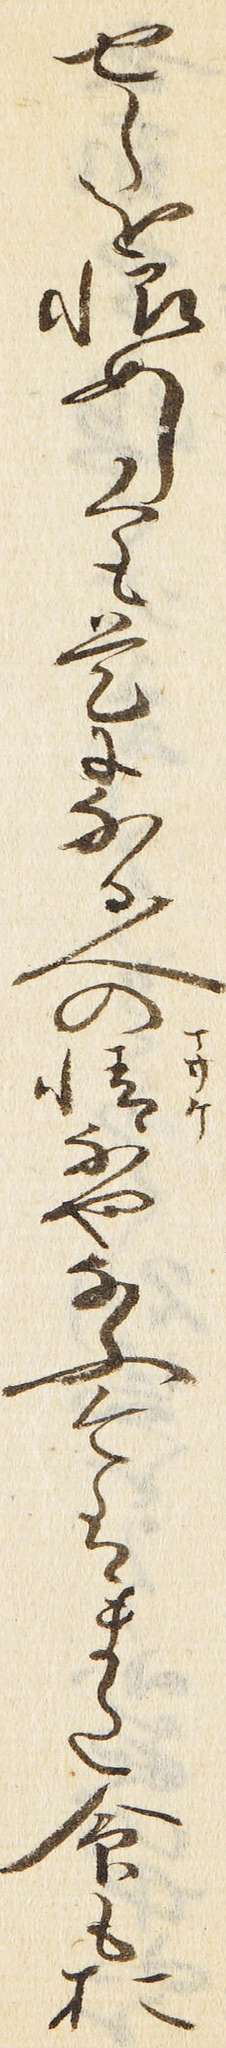せしを恨めしくも是になる人の情なやなふ今そまた命もお
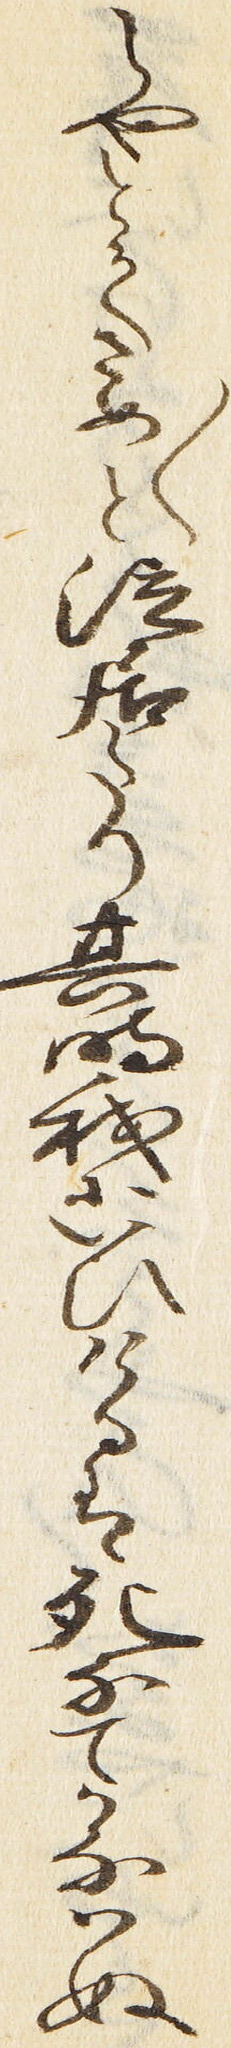しやとてさめ〳〵と泣居たり其時我等いひけるは死なてかなはぬ
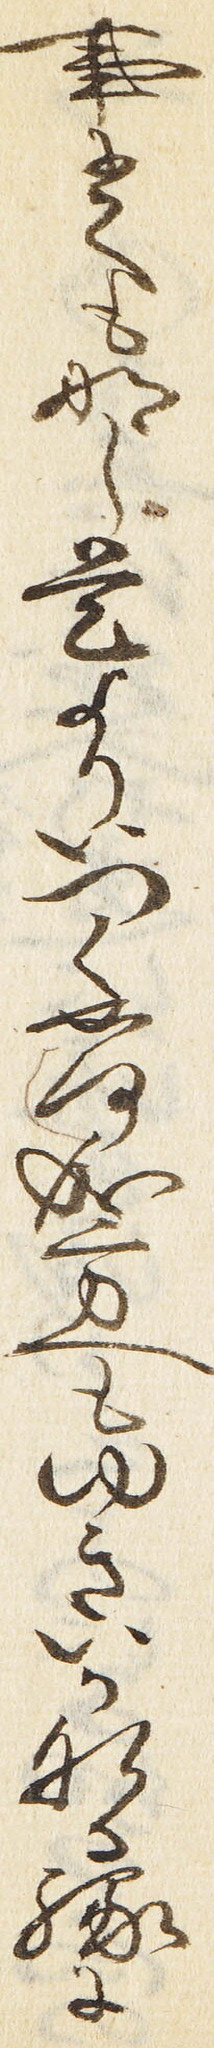事にてもなし是よりいつく如何成方へもゆきいかなる縁に
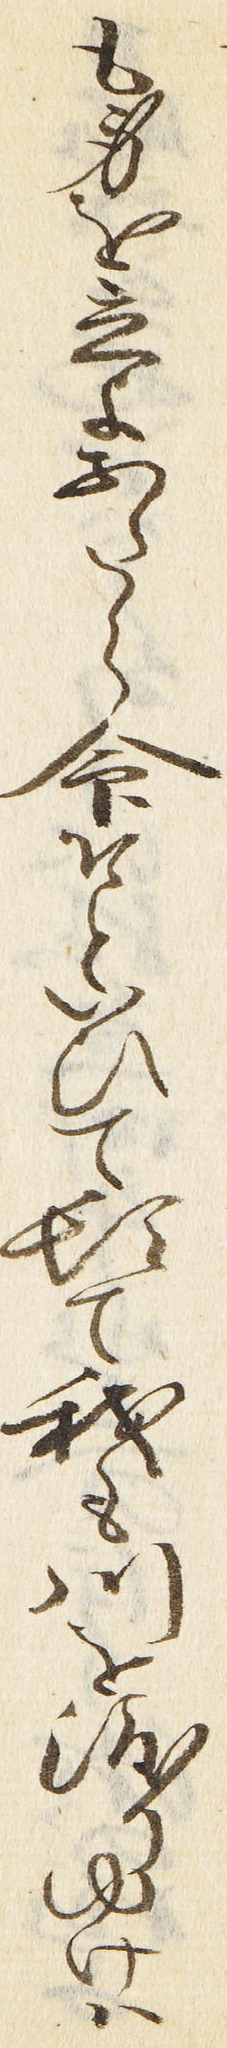も身を立よあたあたら命そといひて頓て我も川を渡りゆけは
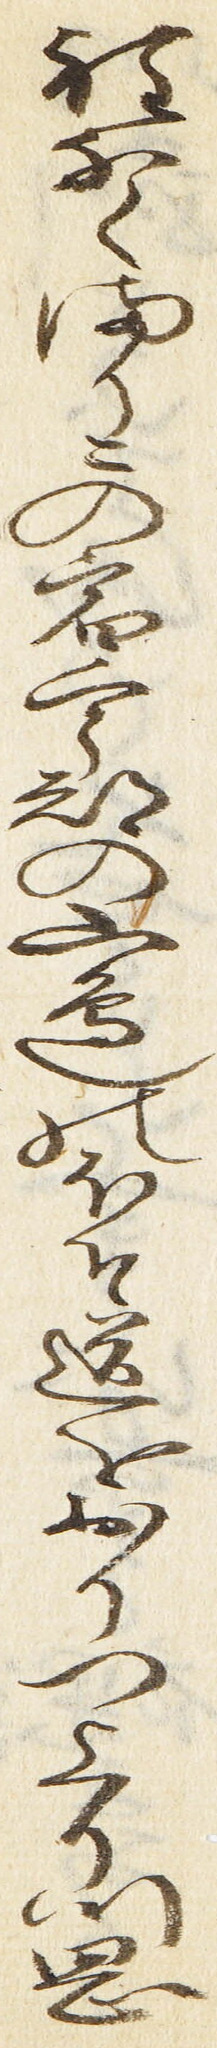程なくまりこの宿宇都の山辺のほそ道をおりつの上りつ岡
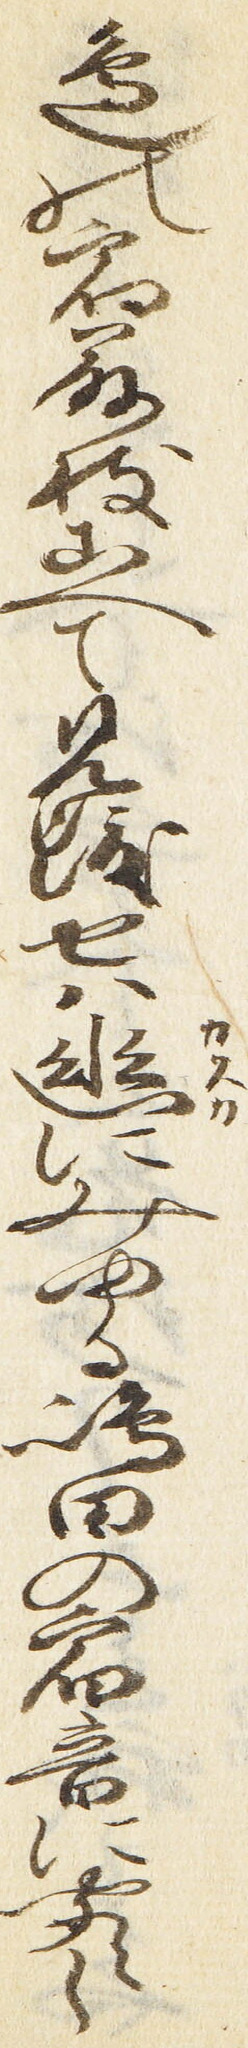辺の宿藤枝こへて見渡せは幽にみゆる嶋田の宿音に聞えし
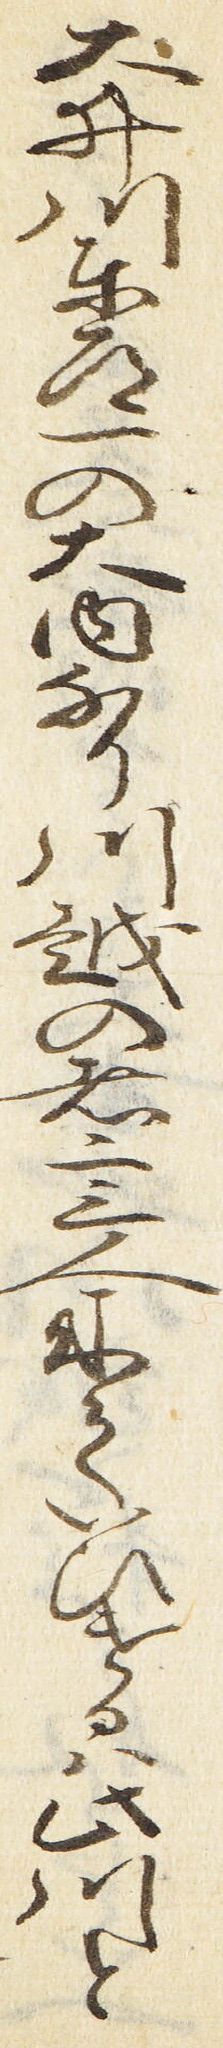大井川東道一の大内なり川越の者二三人来ていひけるは此川と
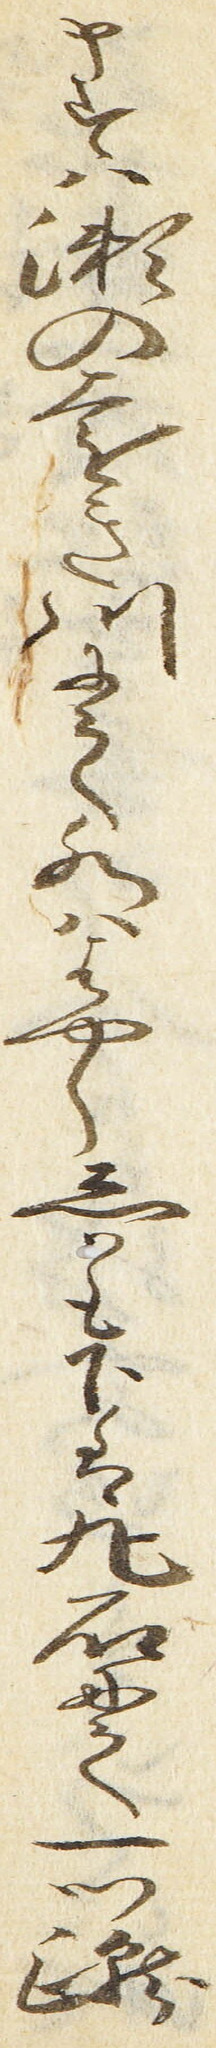申すは瀬の遠き川にて水ははやくしかも下は丸石にて一ツ蹴
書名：海陸世話日記
